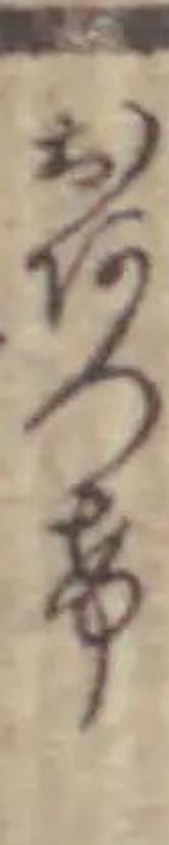おあつけ
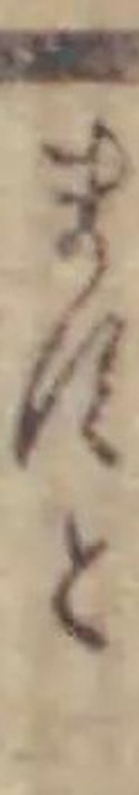ますと
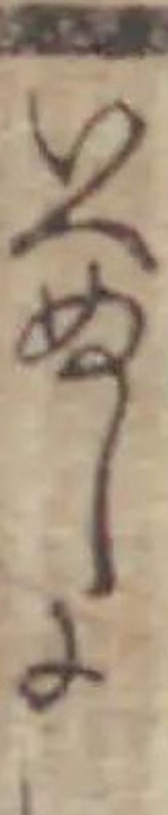いへぬしに
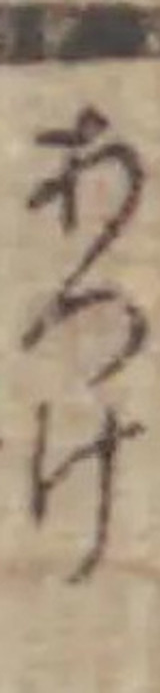あつけ
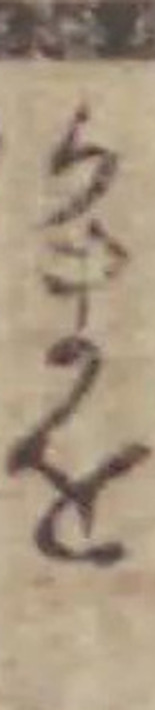かまを
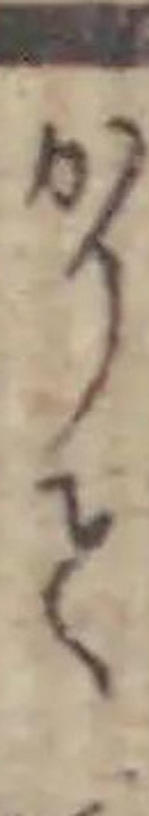かりて
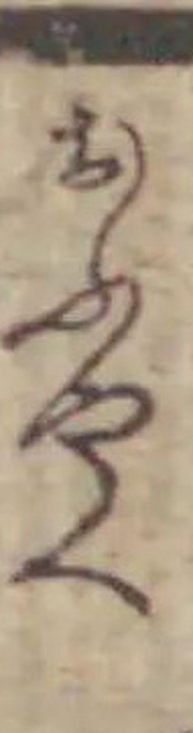おふやへ
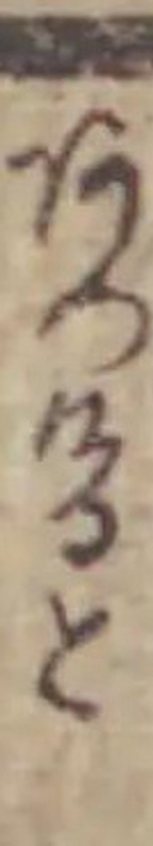あつけると
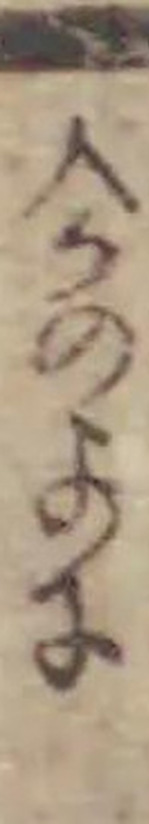今のよに
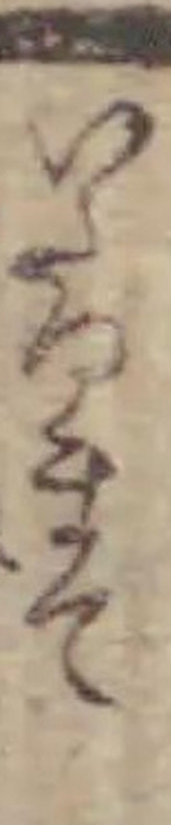いたるまて
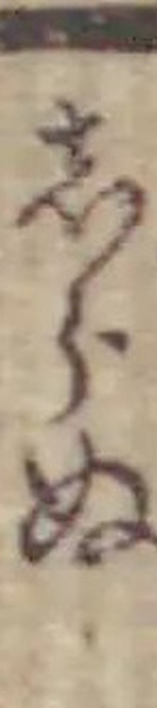しらぬ
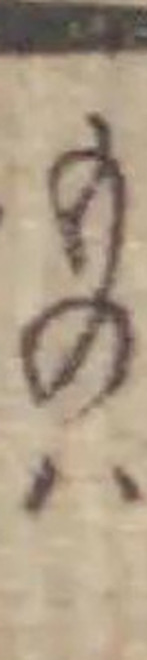ものは
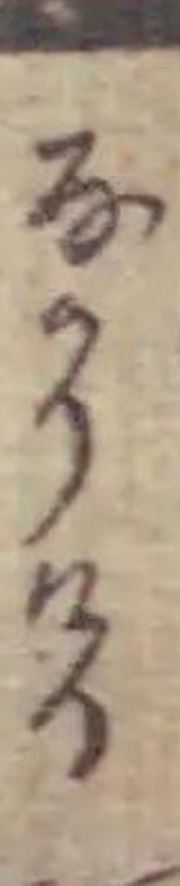なかりけり

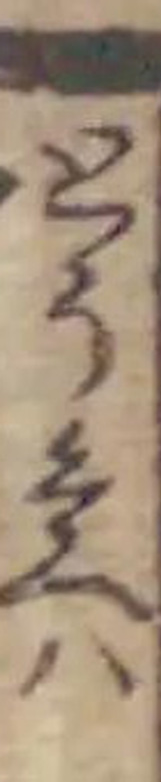とう兵へは
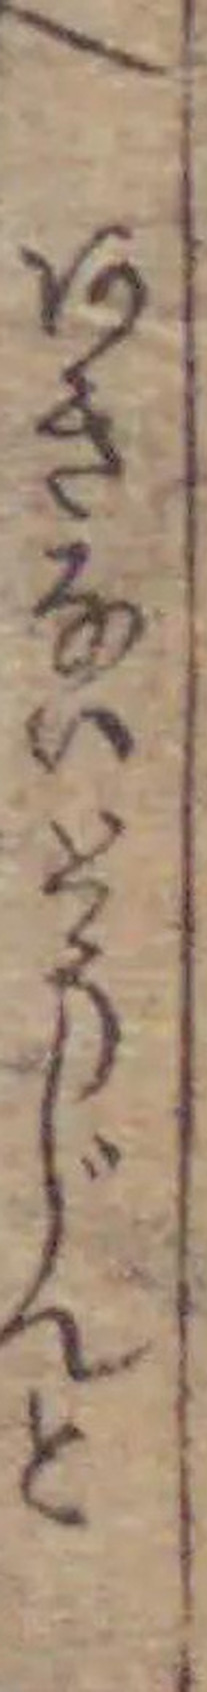あきないとうじんと
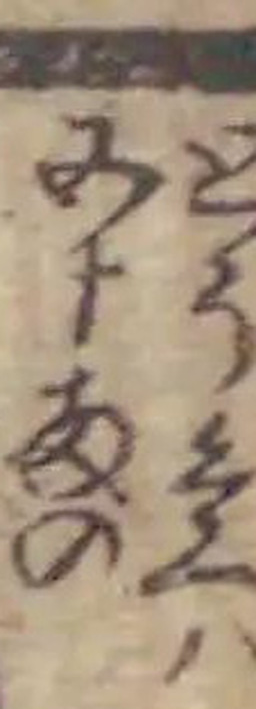五十両の
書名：間違月夜鍋 2巻
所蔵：国立国会図書館 National Diet Library, JAPAN
